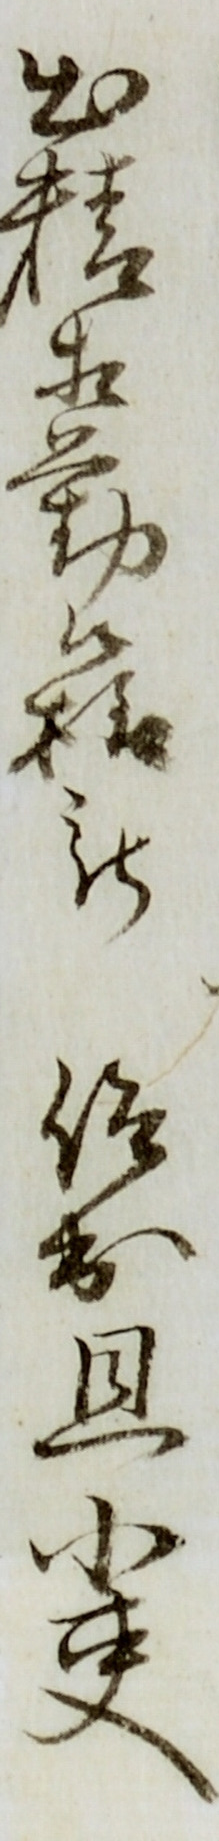出精相勤候様被仰出且小吏
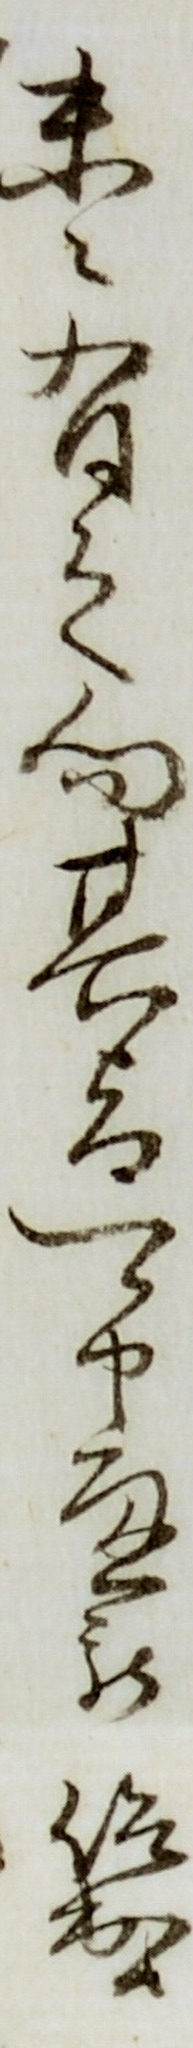末々有之向其旨可申通被仰出候
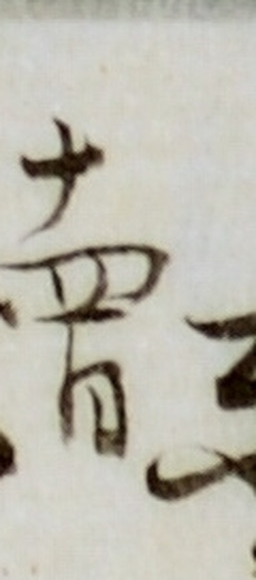十四日
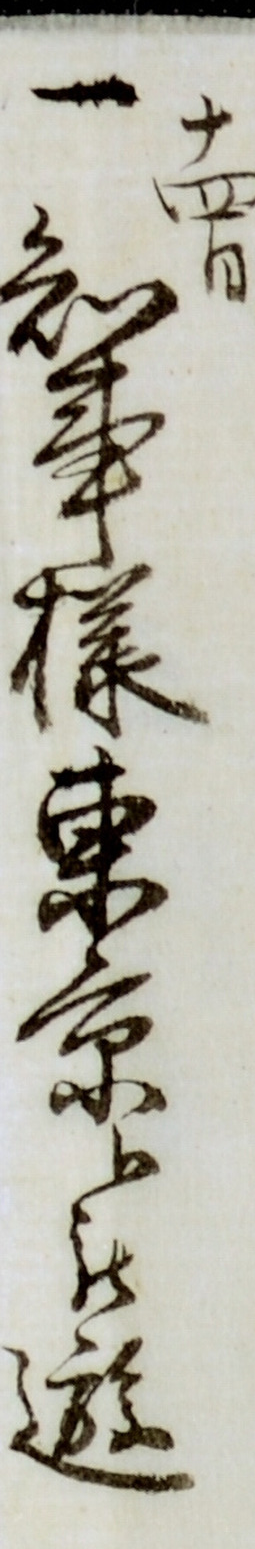一知事様東京え被遊
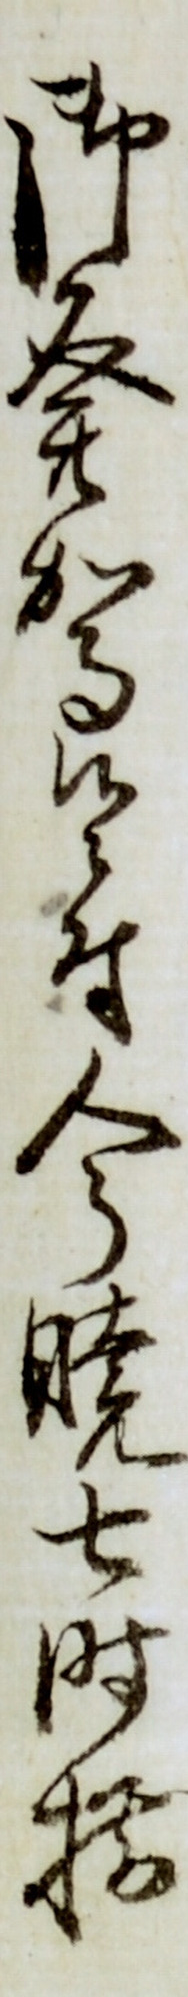御発駕候に付今暁七時揃

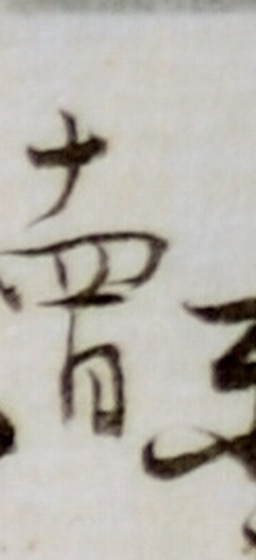十六日
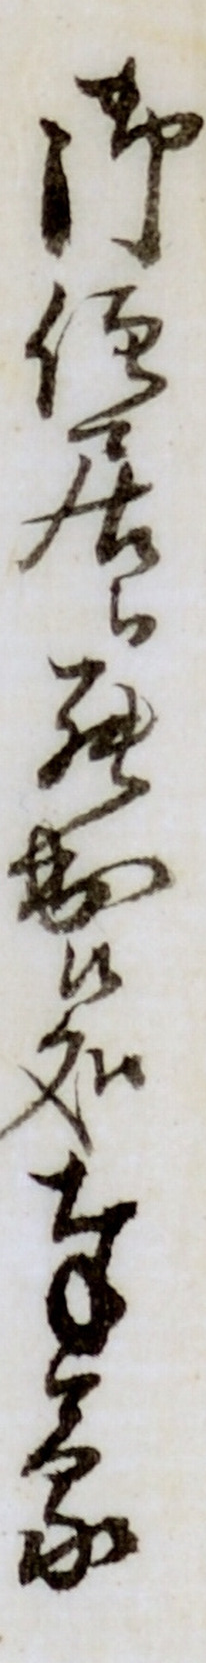御住居え罷出候処奉蒙
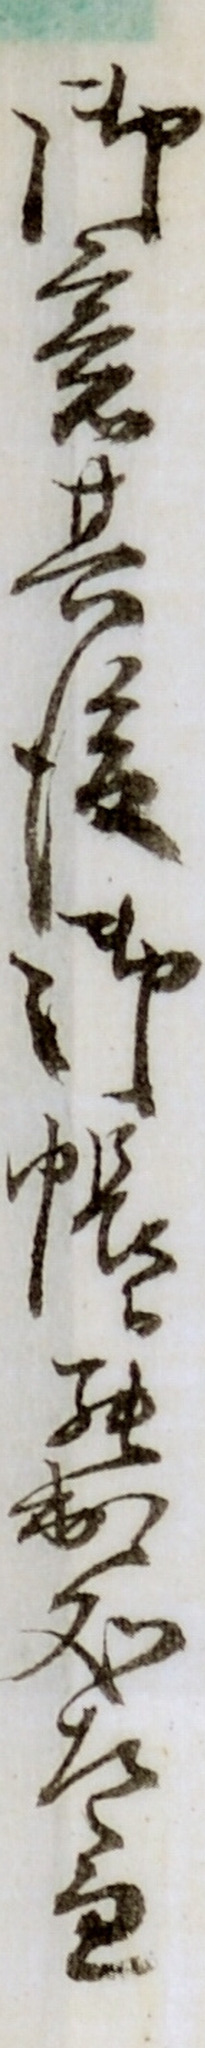御意其後御帳え罷出候処左之通
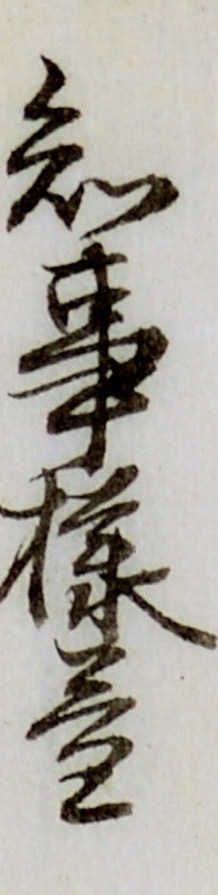知事様益
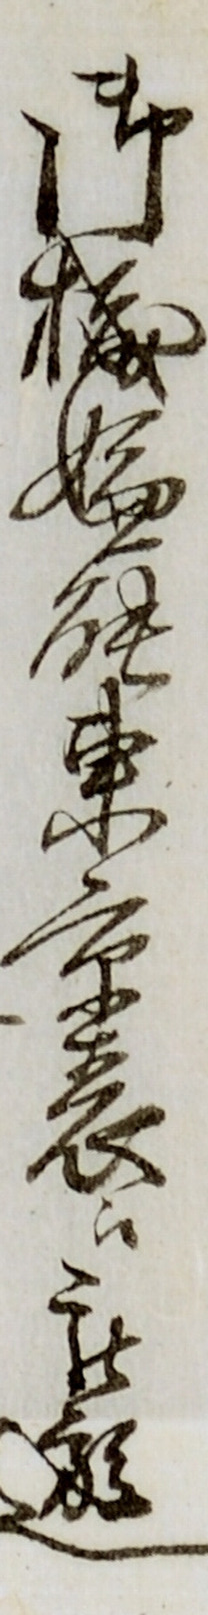御機嫌能東京表え被遊
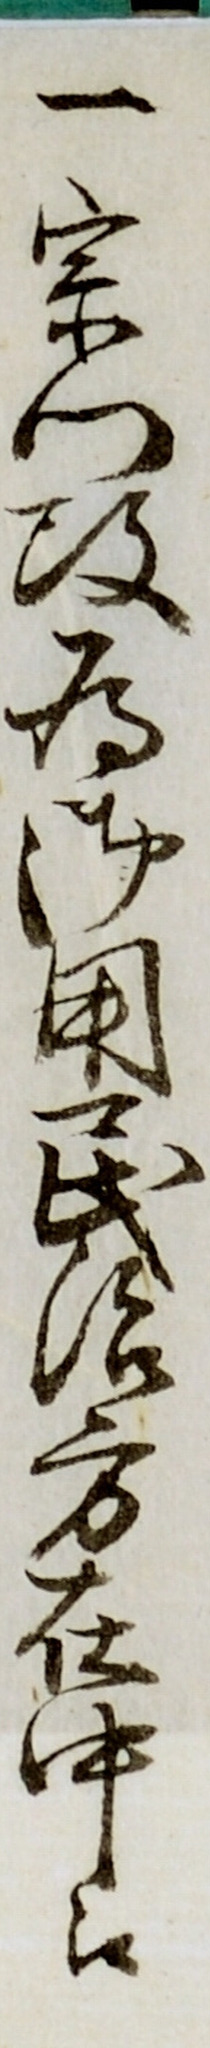一宗門改為御用民治方在中え
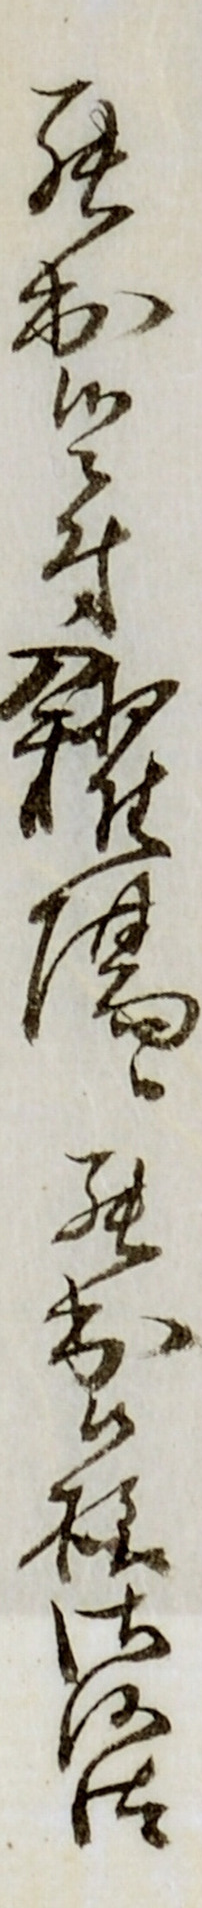罷出候に付糴場え罷出候様御沙汰
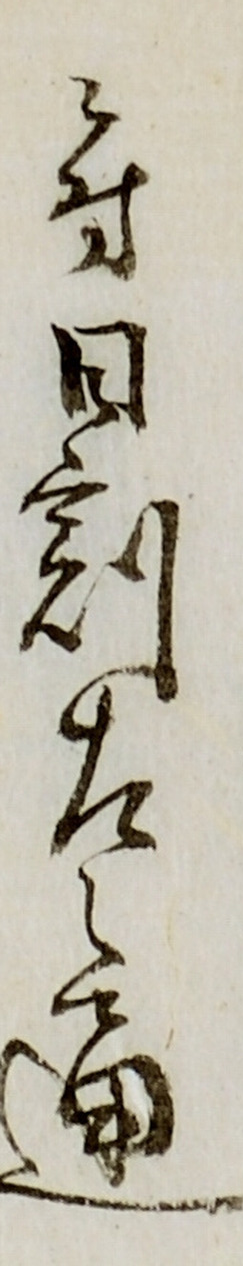に付日割左之通
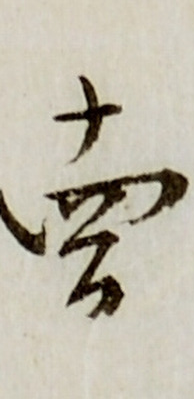十六日
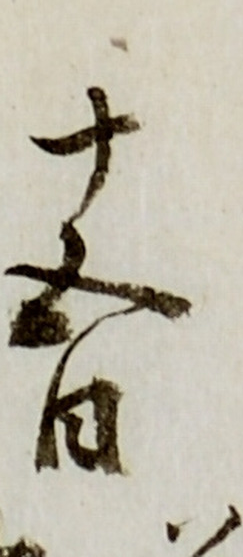十六日
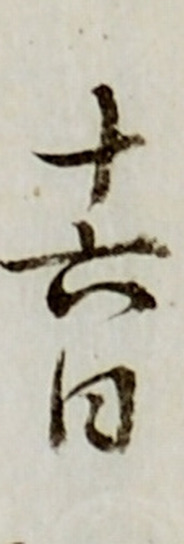十六日
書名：山林方諸事御用留
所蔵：伊那市立高遠町図書館・合同会社AMANE
